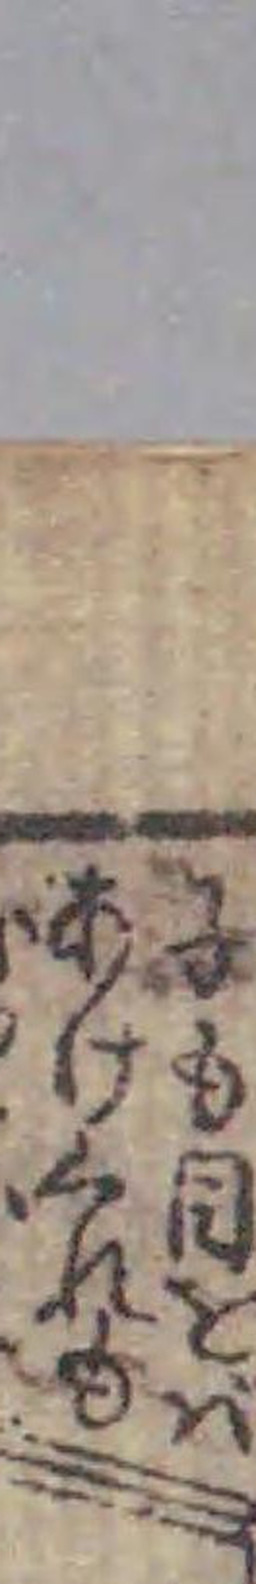あけくれも
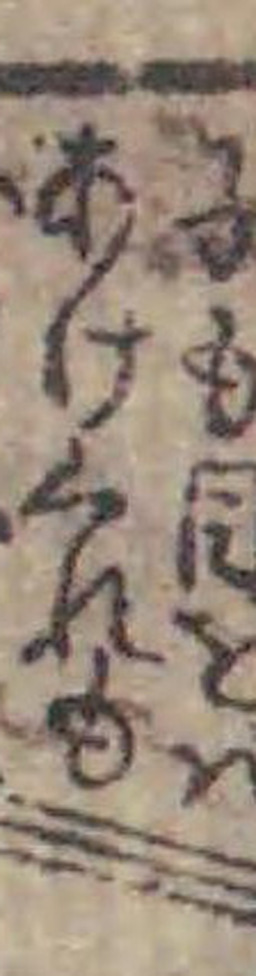あけくれも
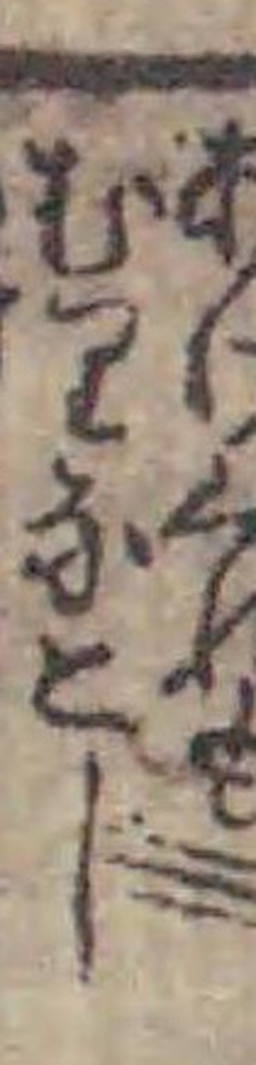むりなこじ
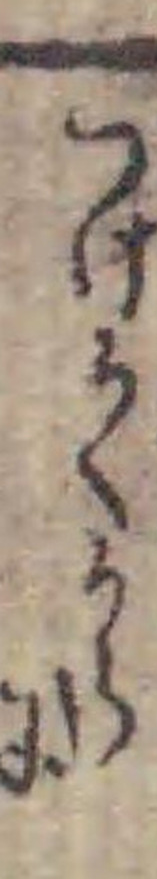つけかくから
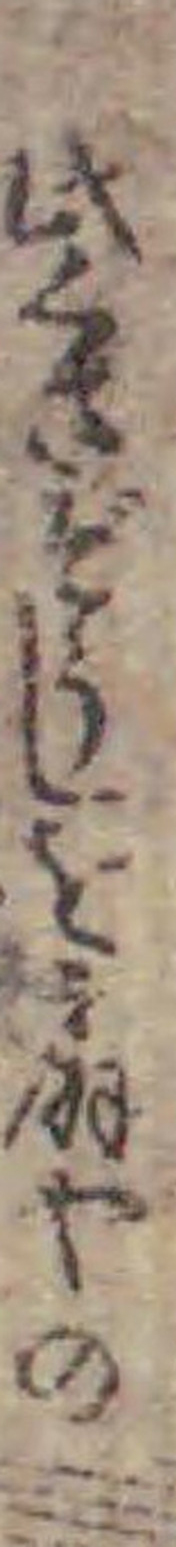此くさぞうしを扇やの
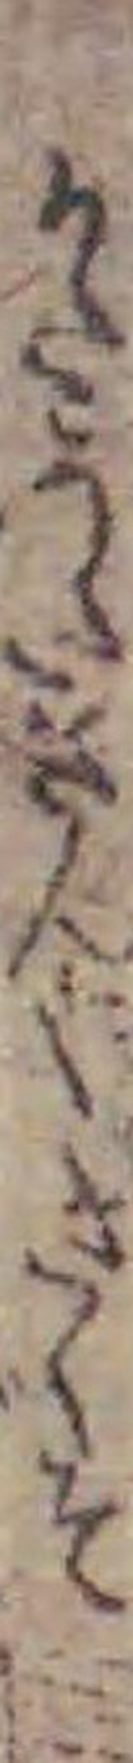かたうたさんやさくそ
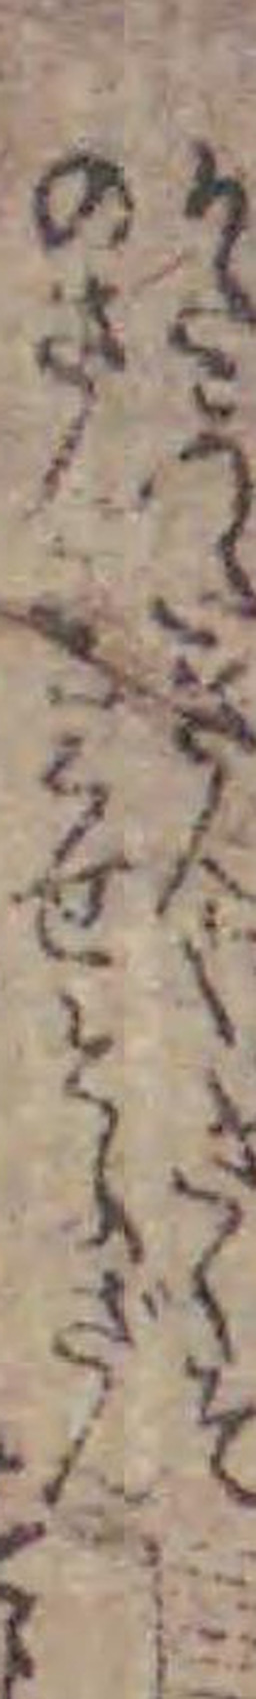のさんにみせとふざん

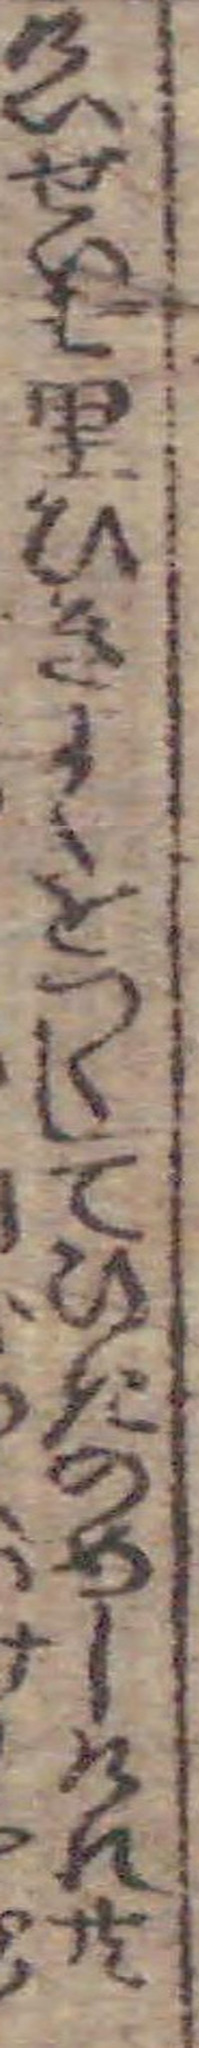けいせい七里ひきよくをつくしてひきのめしけれ共
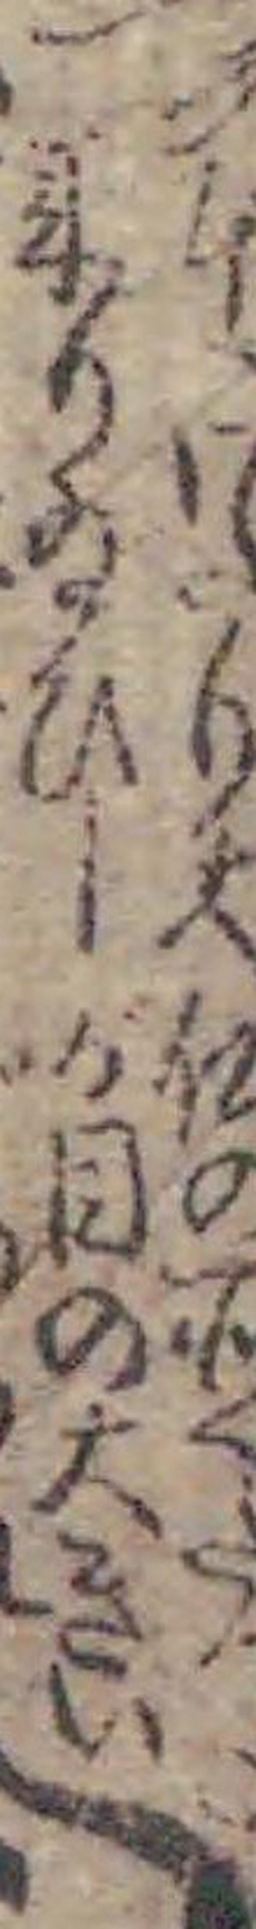来り給ひしが目の大きい
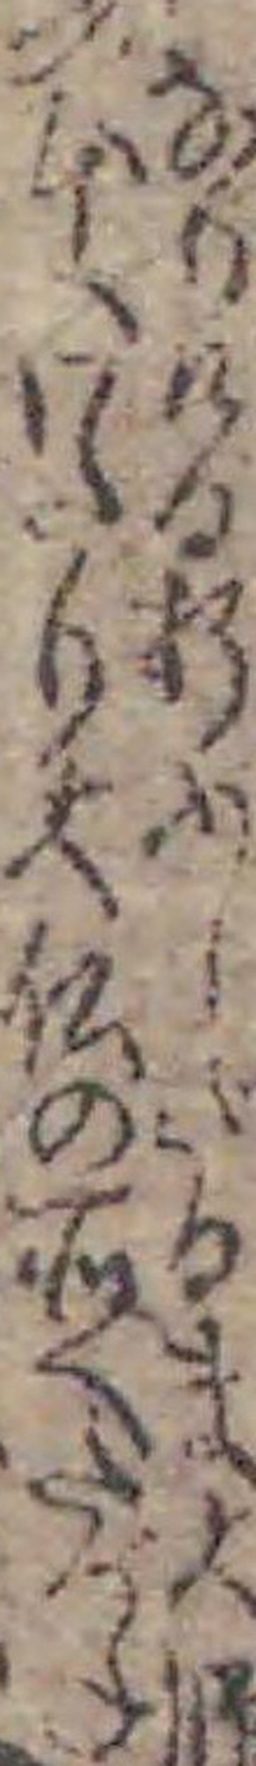本へわたり大仏の所へたづね
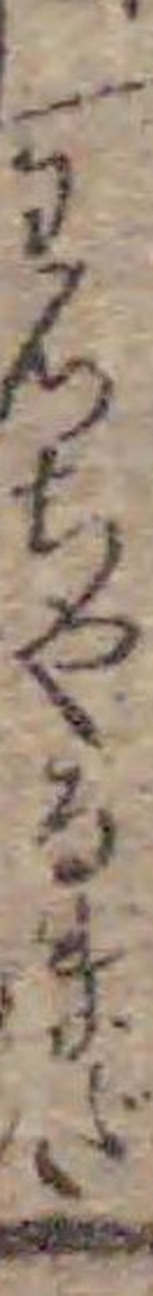わつちやるまだ
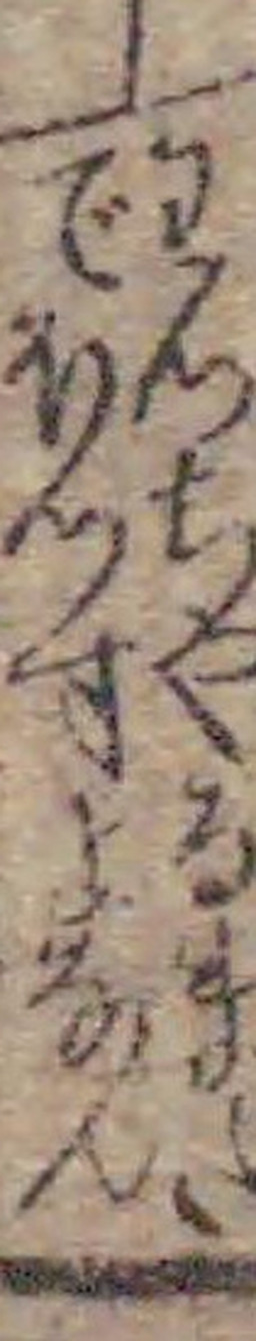でほつすよなん
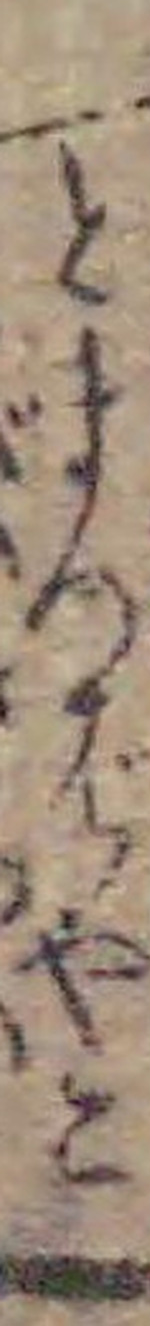とまつばやこ
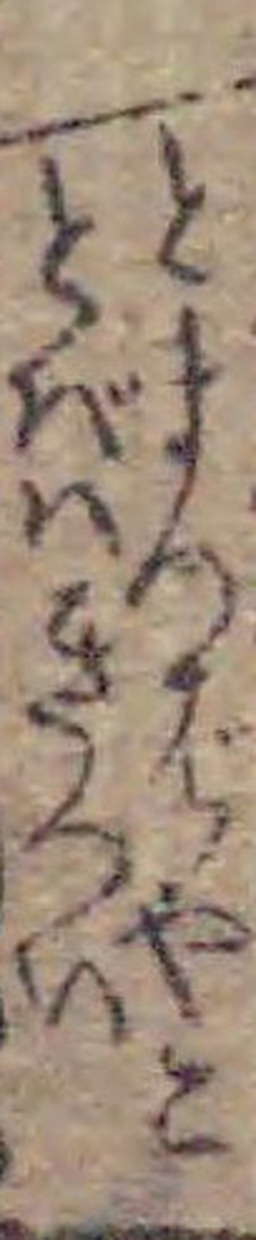とばはきつい
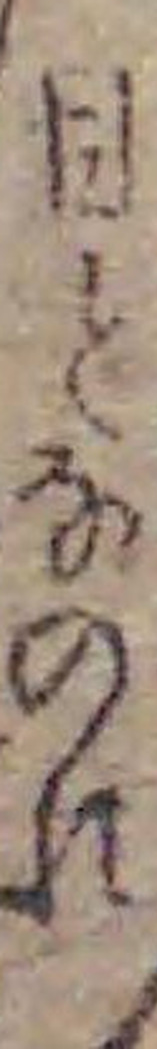目となのれ

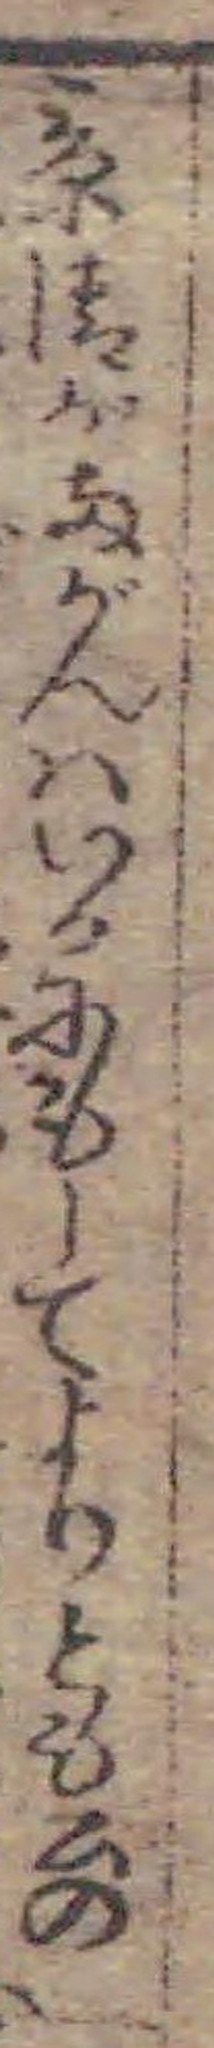景清が両がんはいかにもしてよりとも公の
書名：悪七変目景清 : 2巻
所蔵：国立国会図書館 National Diet Library, JAPAN
